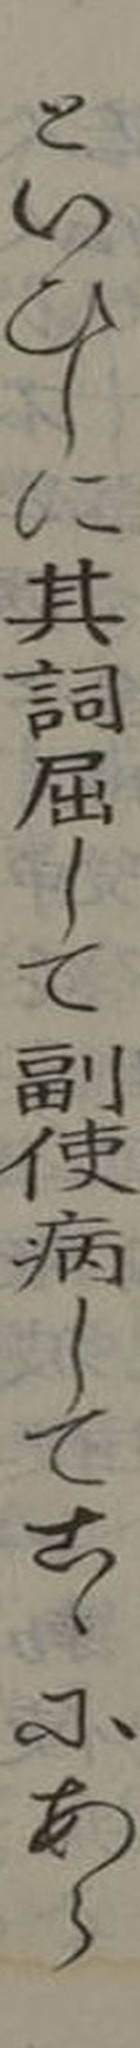といひしに其詞屈して副使病してこゝにあら
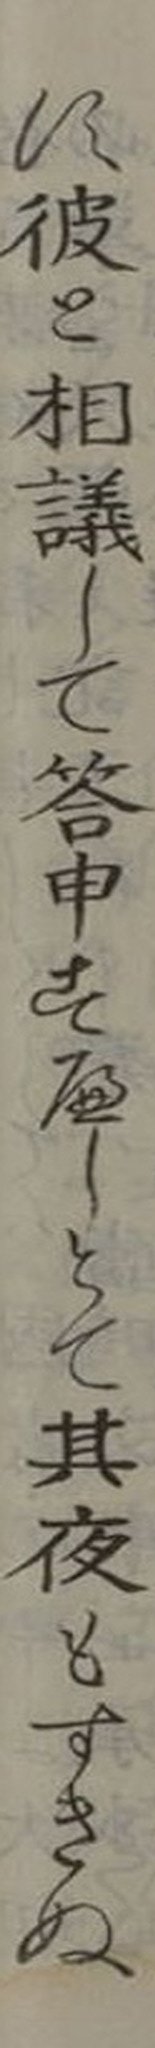す彼と相議して答申すへしとて其夜もすきぬ
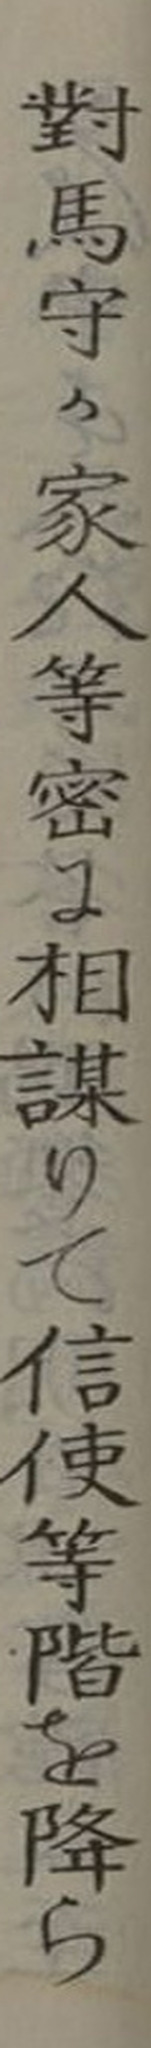對馬守か家人等密に相謀りて信使等階を降ら
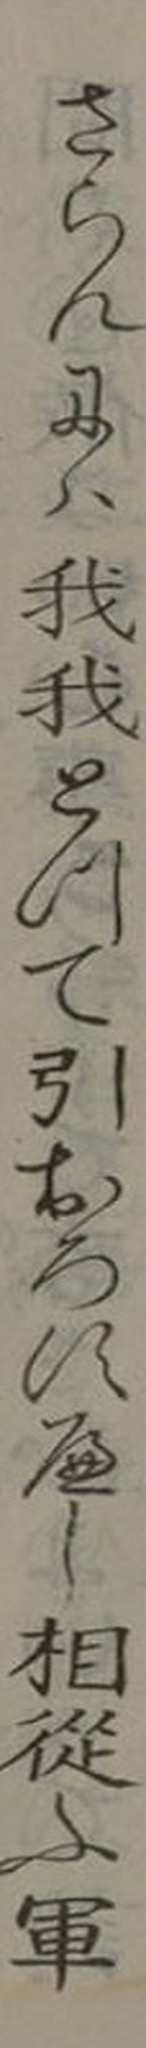さらんには我我とつて引おろすへし相従ふ軍
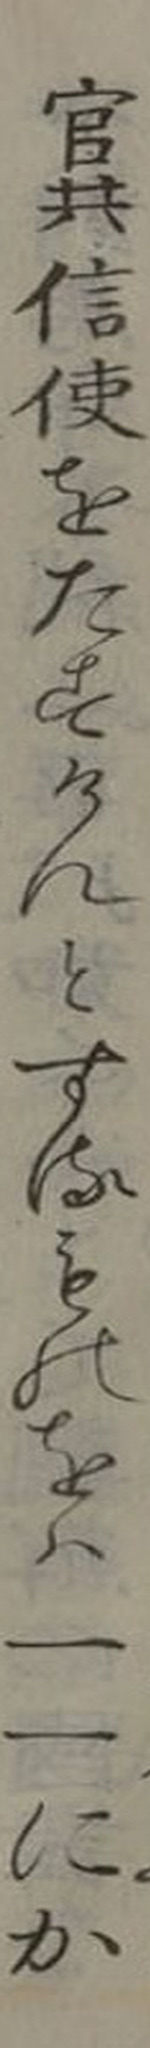官共信使をたすけんとするものをは一一にか
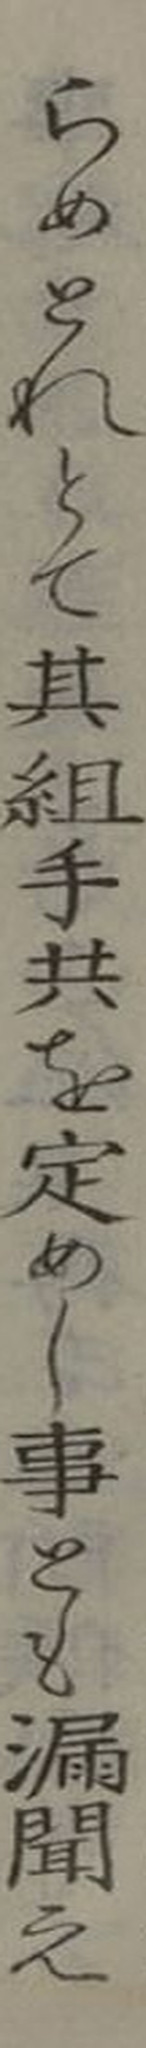らめとれとて其組手共を定めし事とも漏聞え
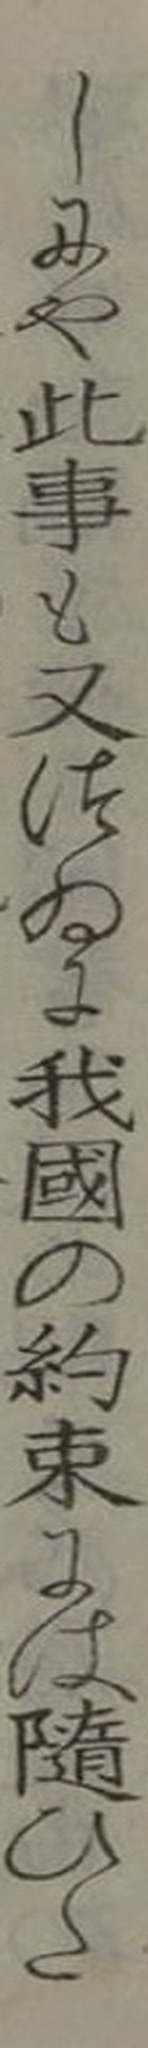しにや此事も又つゐに我國の約束には隨ひた
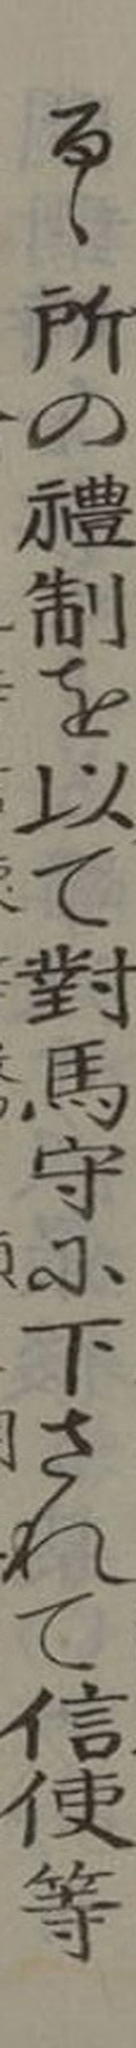るゝ所の禮制を以て對馬守に下されて信使等

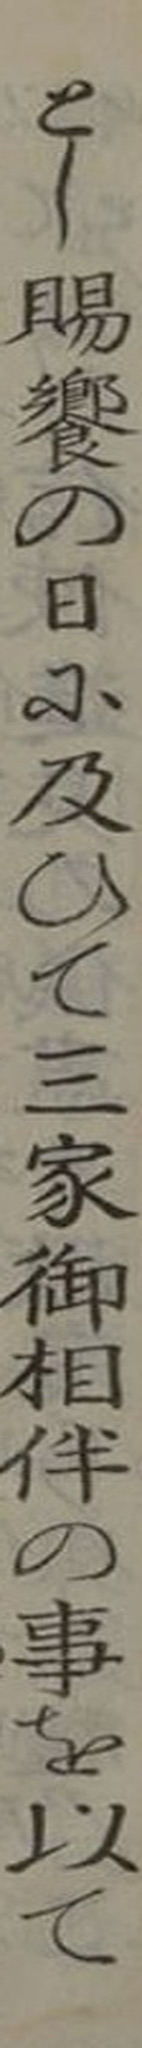とし賜饗の日に及ひて三家御相伴の事を以て
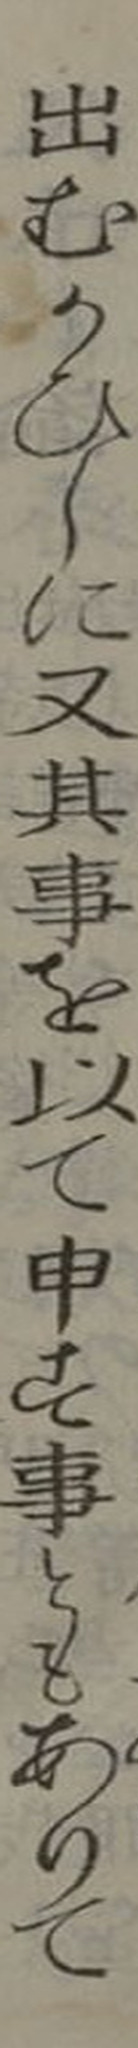出むかひしに又其事を以て申す事ともありて
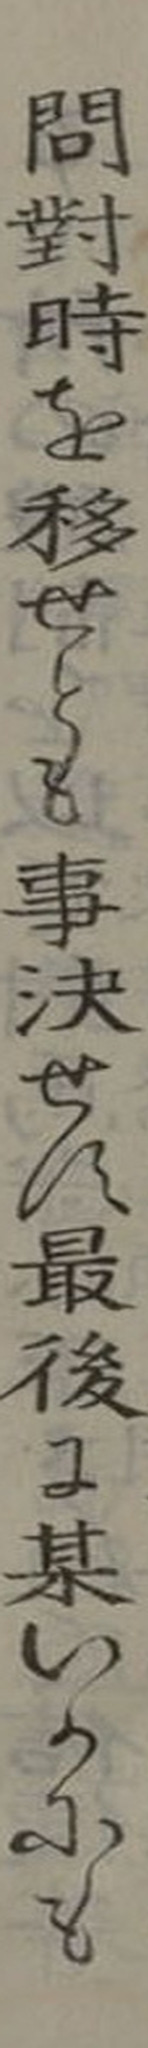問對時を移せとも事決せす最後に某いかにも
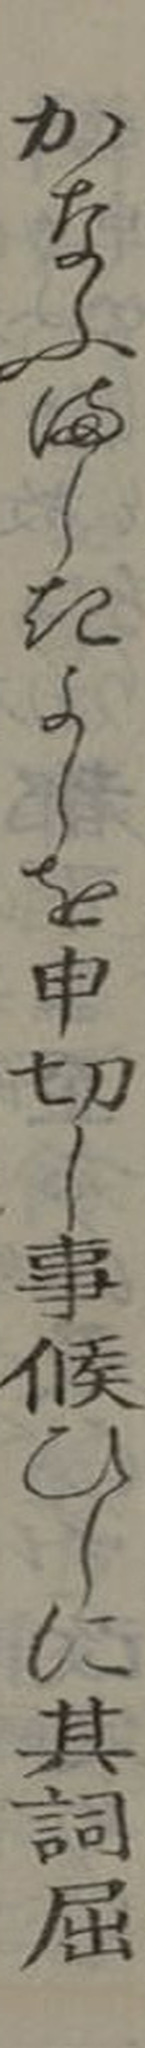かなふましきよしを申切し事候ひしに其詞屈
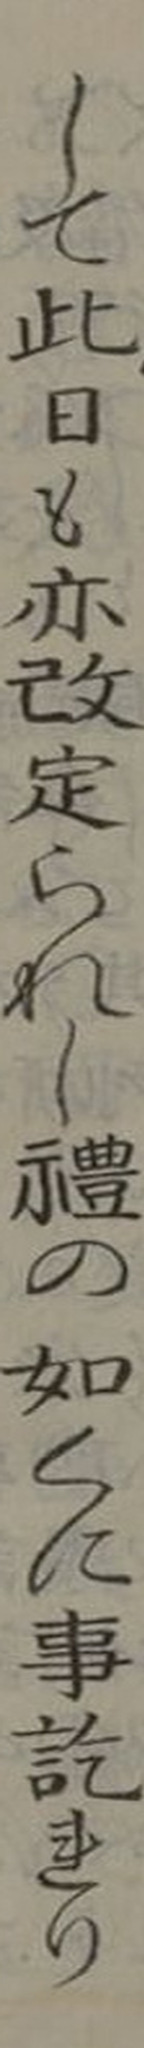して此日も亦改定られし禮の如くに事訖れり
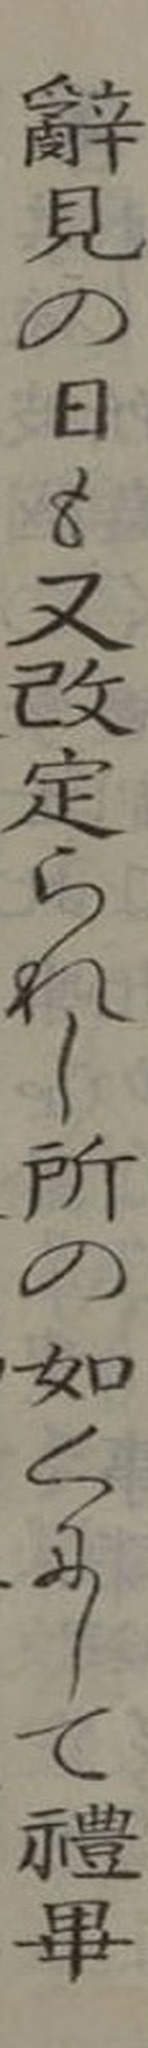辭見の日も又改定られし所の如くにして禮畢
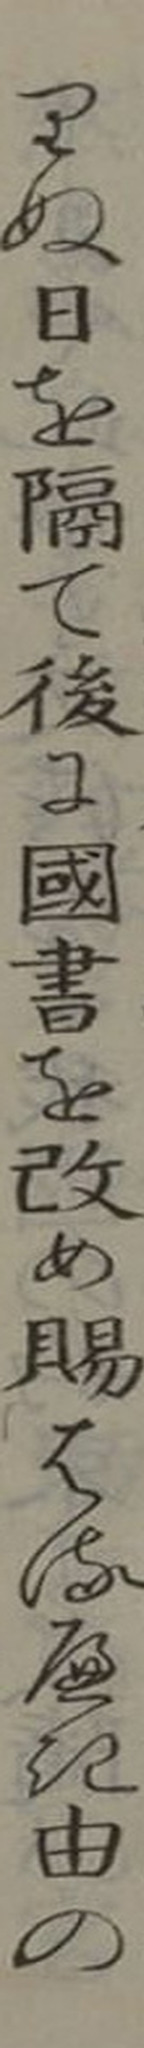りぬ日を隔て後に國書を改め賜はるべき由の
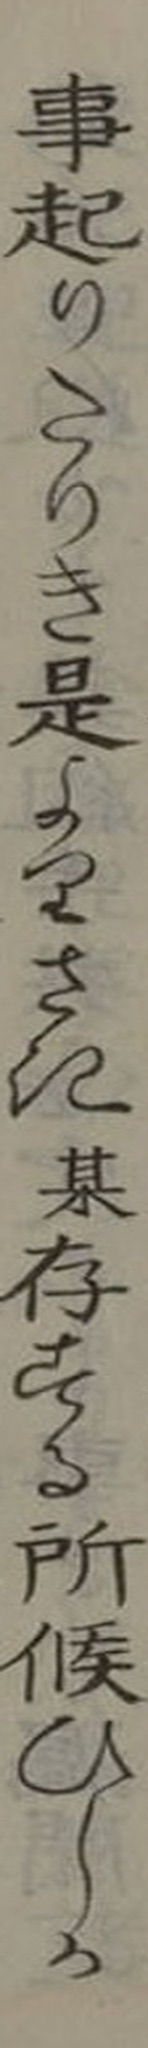事起りたりき是よりさき某存する所候ひしか
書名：骨董録
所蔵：University of the Ryukyus Library
